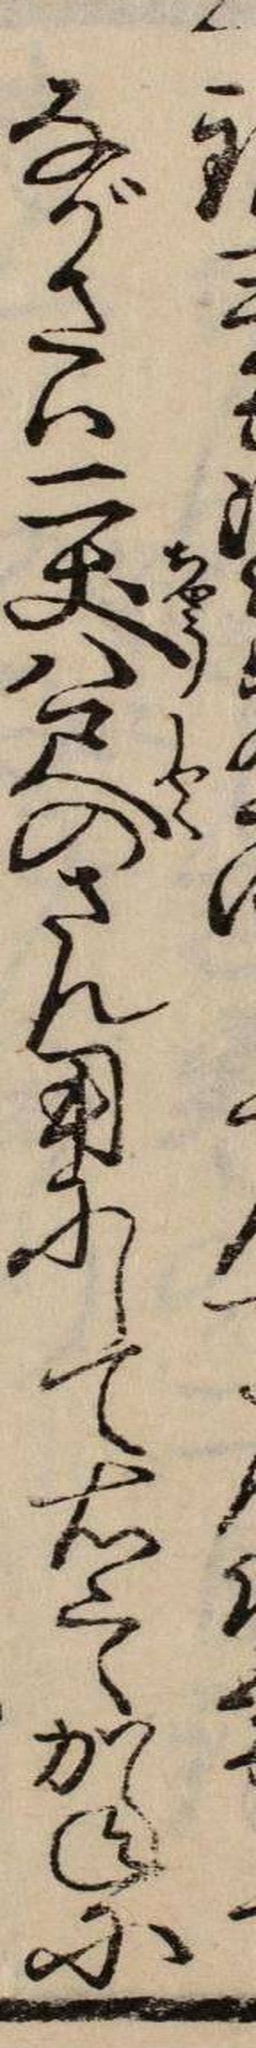ながさは二丈八尺のさん用にして右のかねに
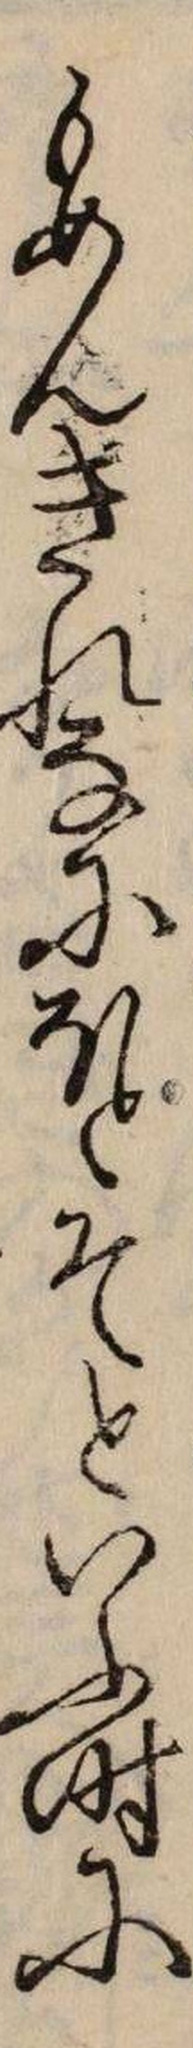もめんきれなにほとそといふ時に
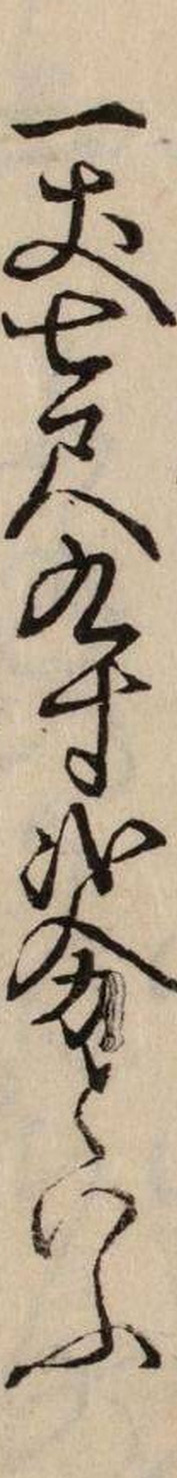一丈七尺九寸弐分といふ
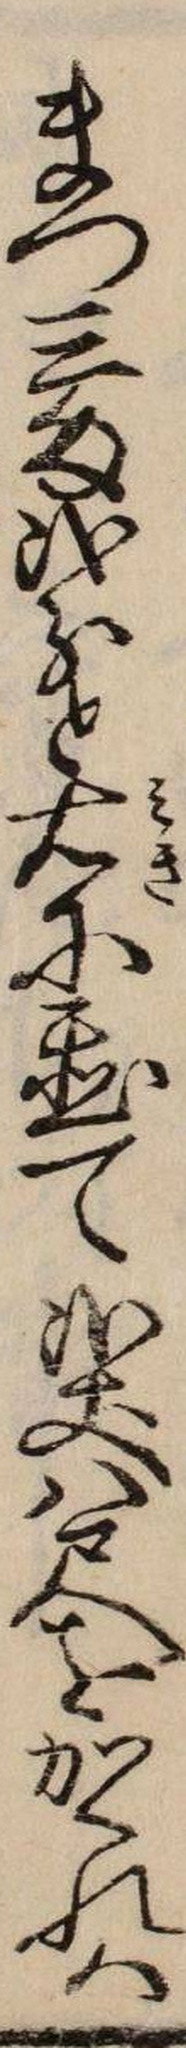まつ三匁弐分と右に置て弐丈八尺をかくれは
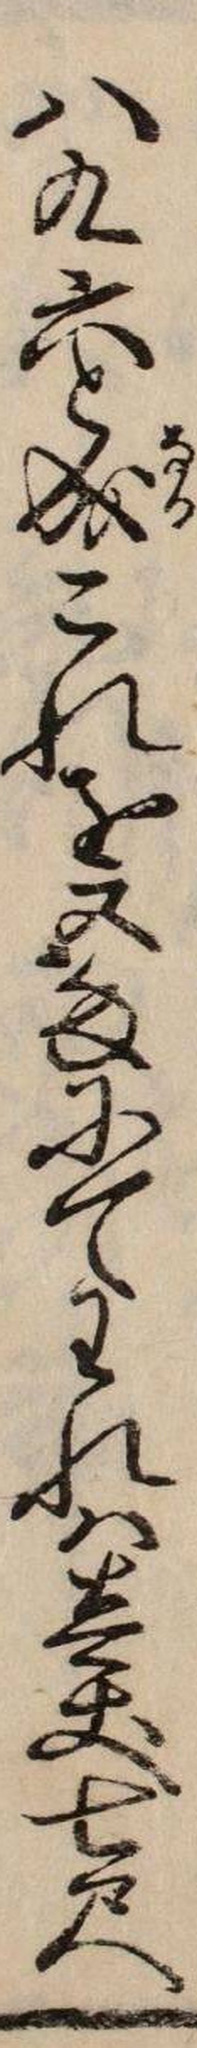八九六と成これを五匁にてわれは壱丈七尺
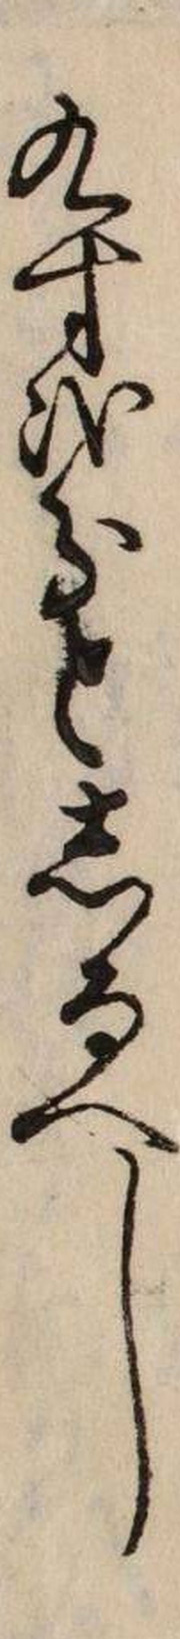九寸弐分としるへし

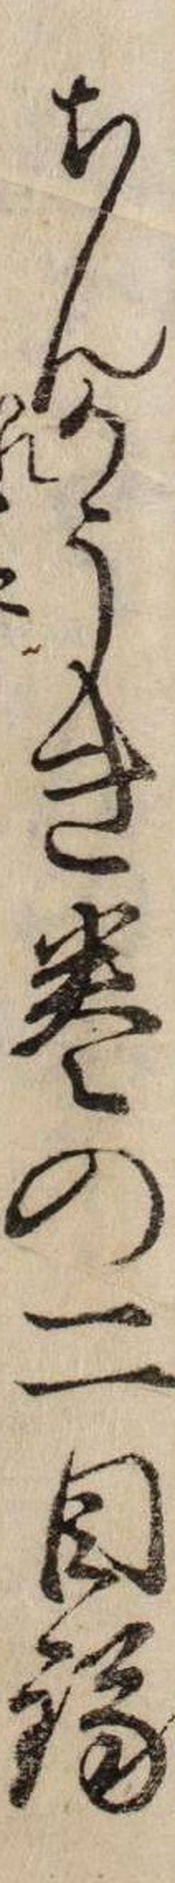ちんかうき巻の二目録
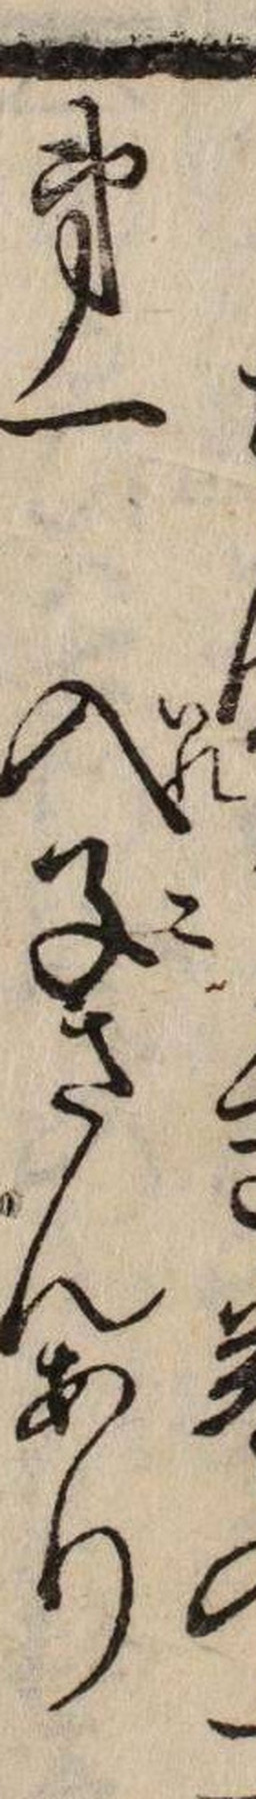第一入子さんあり
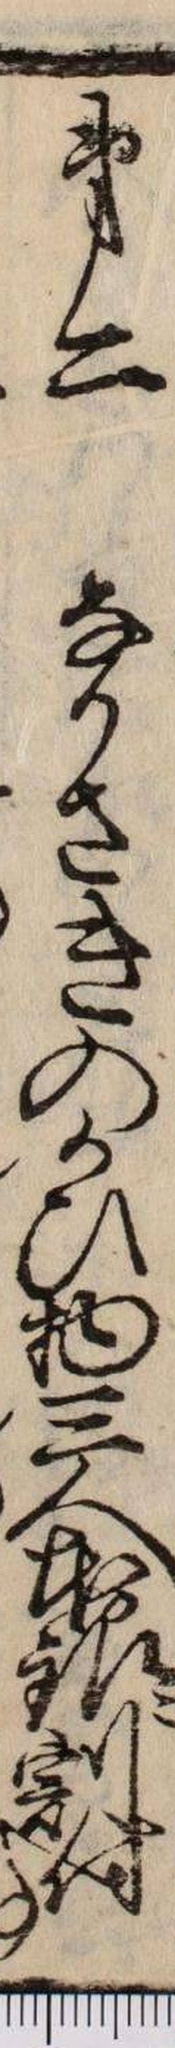第二なかさきのかひ物三人本銀割付事
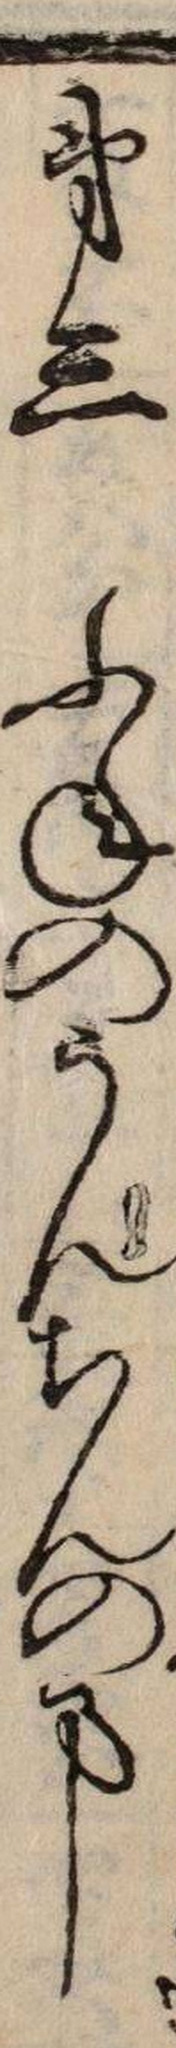第三ふねのうんちんの事
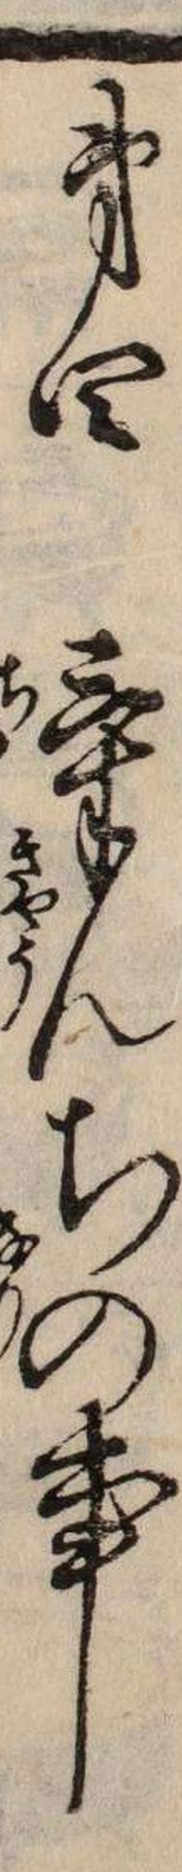第四けんちの事
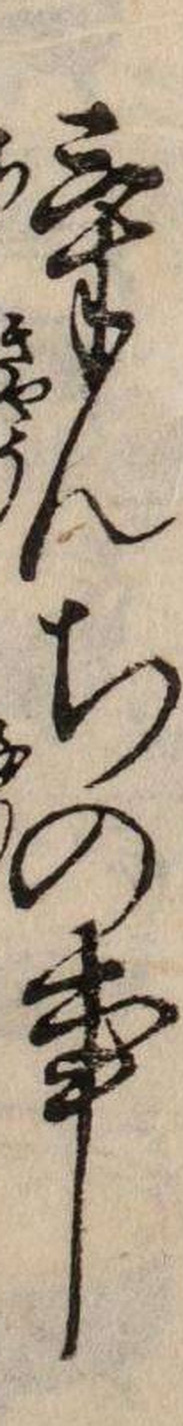第四けんちの事
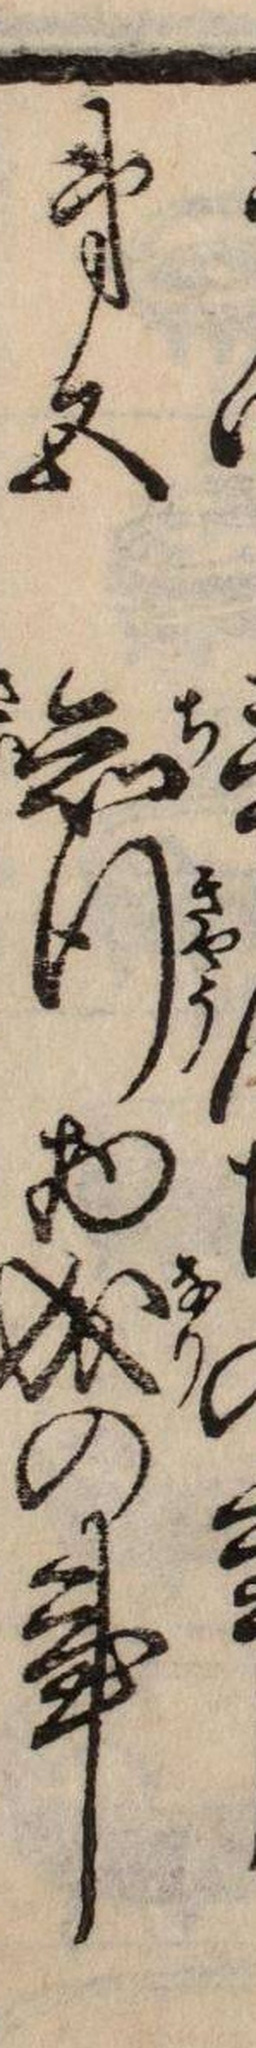第五知行物成の事
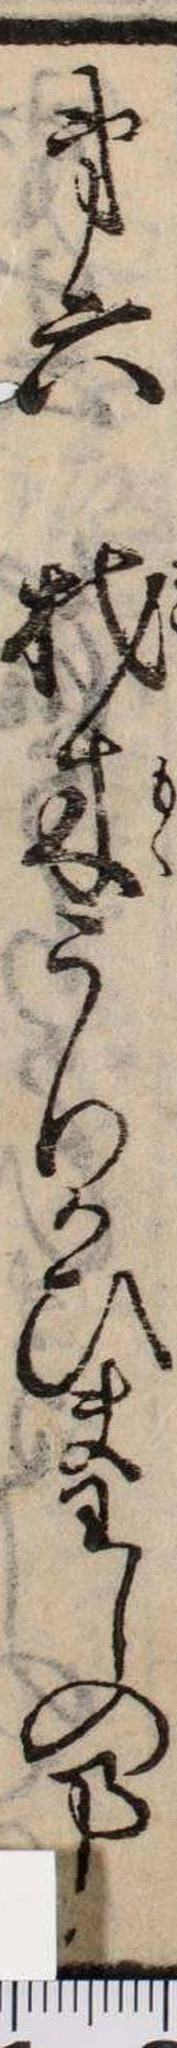第六材木うりかひまわしの事
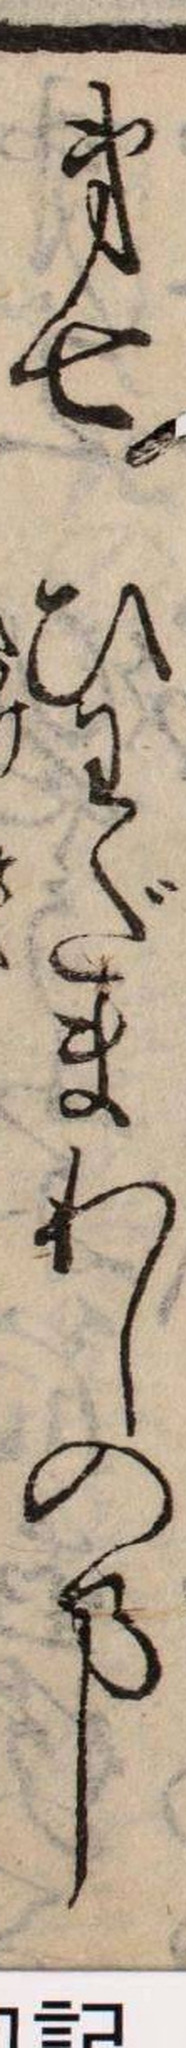第七ひわだまわしの事
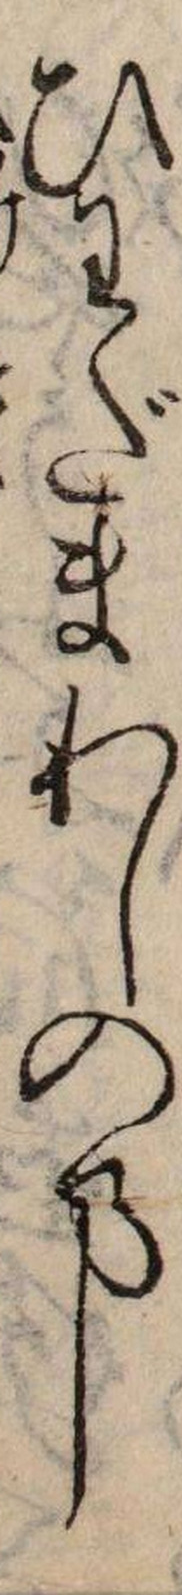第七ひわだまわしの事
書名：塵劫記（寛永11年自跋、京都府立京都学・歴彩館追貴8）
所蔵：京都府立京都学・歴彩館 国文学研究資料館
